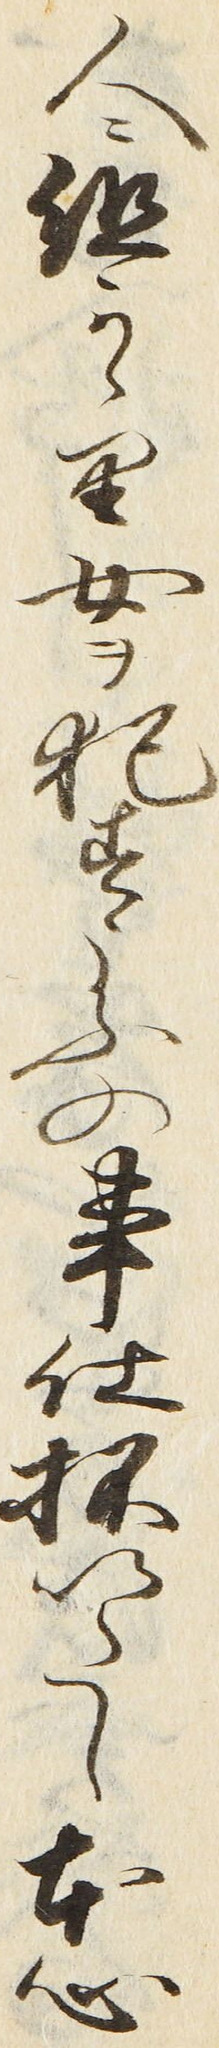人ニ組かゝり女ヲ犯すよふの事仕抔いたし本心
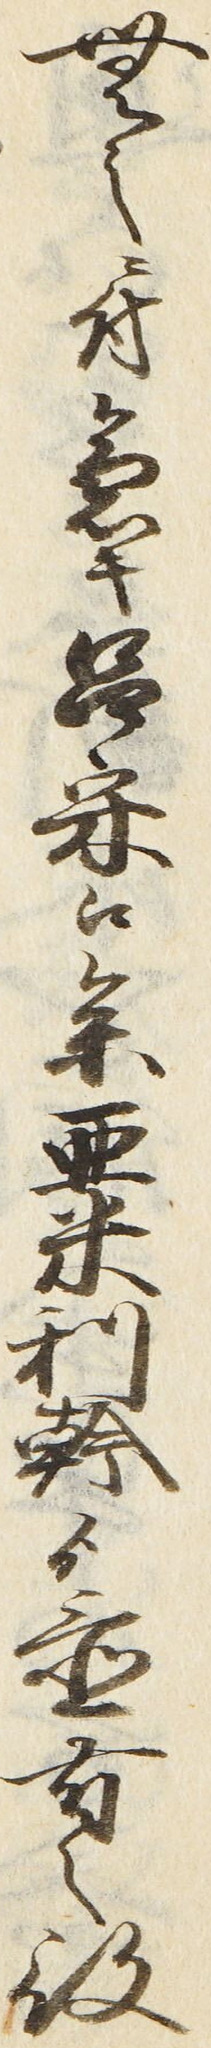無之ニ付急キ呂宋江参亜米利幹ゟ置有之役
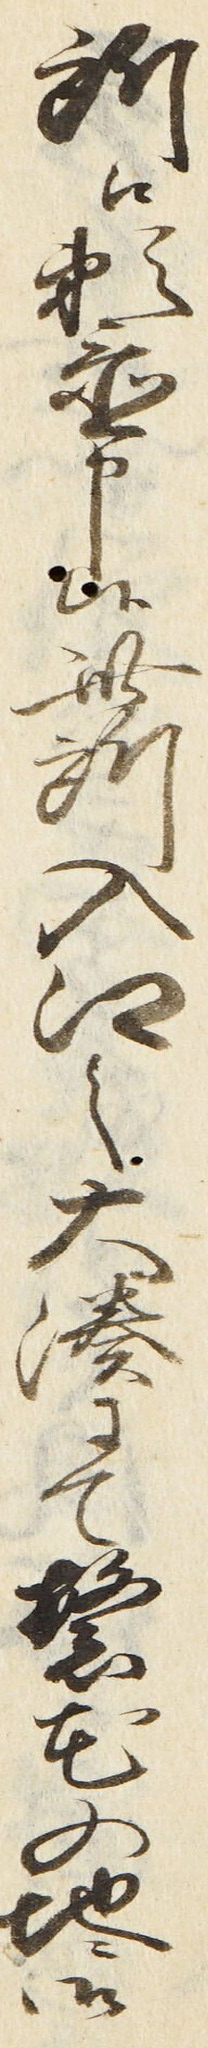所江頼置申候此所入江之大湊にて繁花の地ニ御
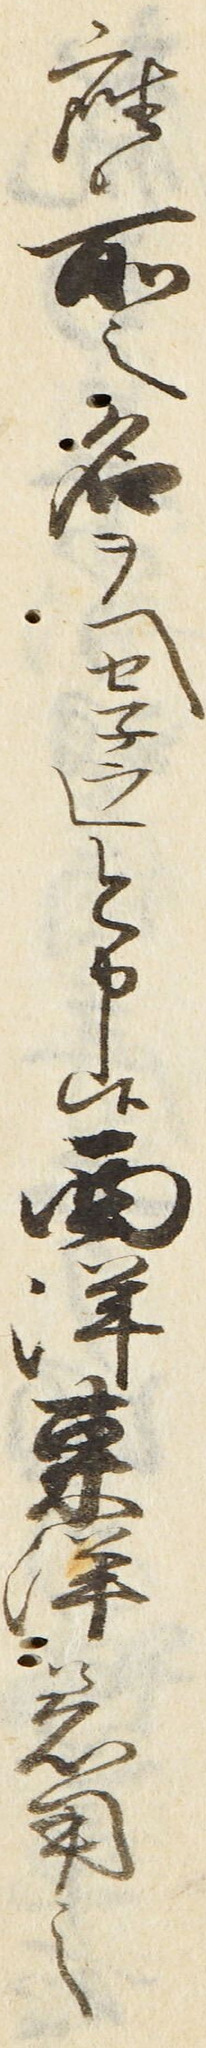座候所之名ヲ「セ子ラ」と申候西洋東洋着用之
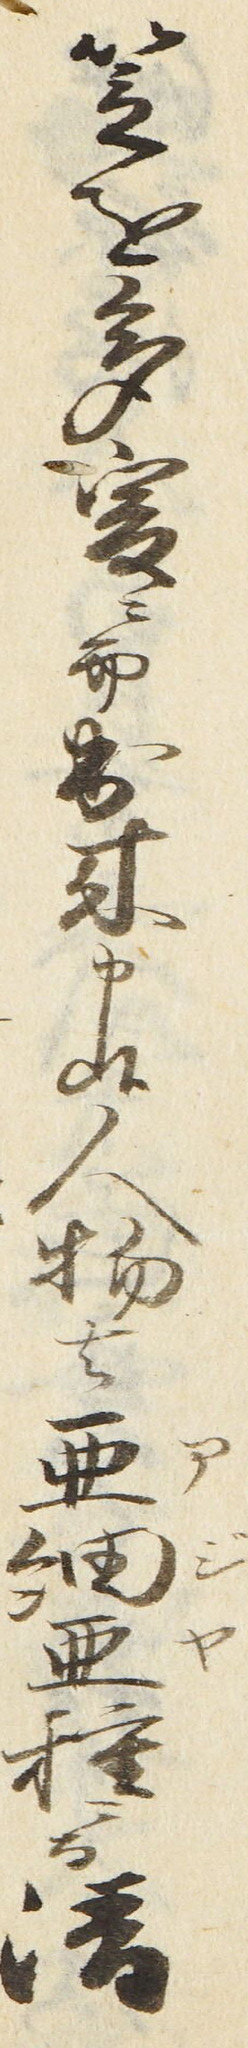笠を多爰ニ而出来申候人物者亜細亜種ニ而清
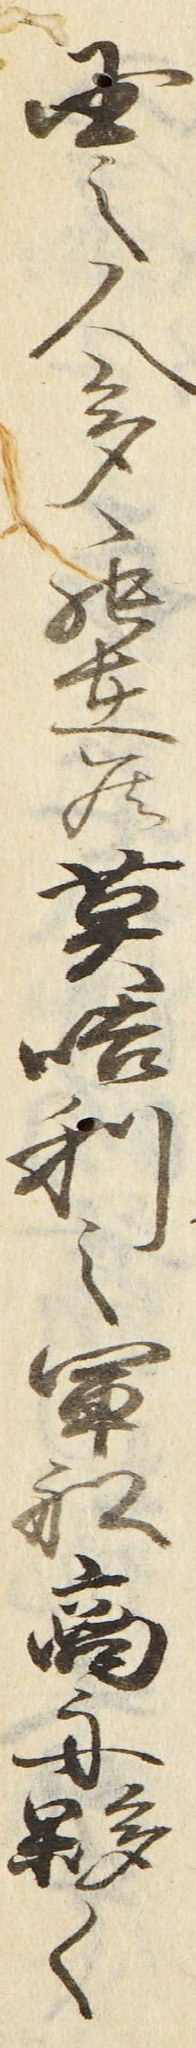国之人多罷在候莫咭利之軍舩商舟夥く

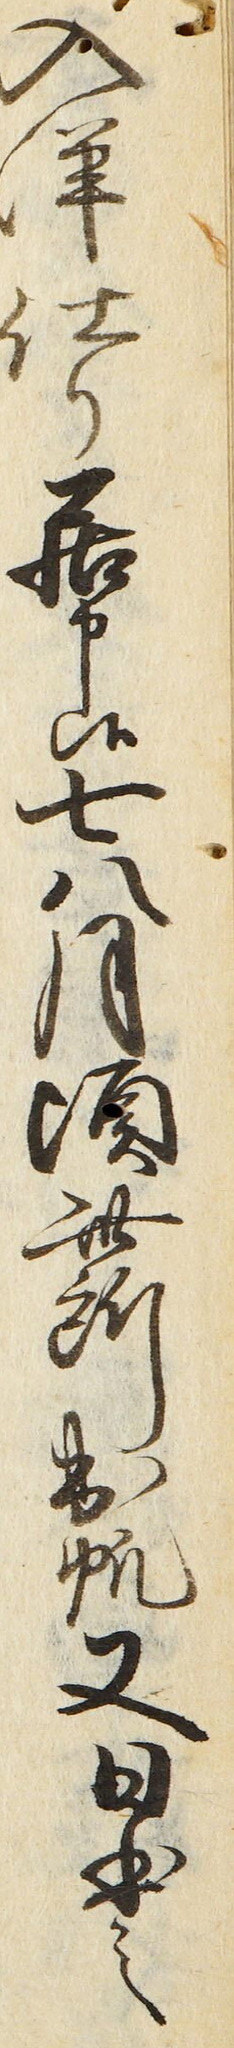入津仕り居申候七八月頃此所出帆又日本之
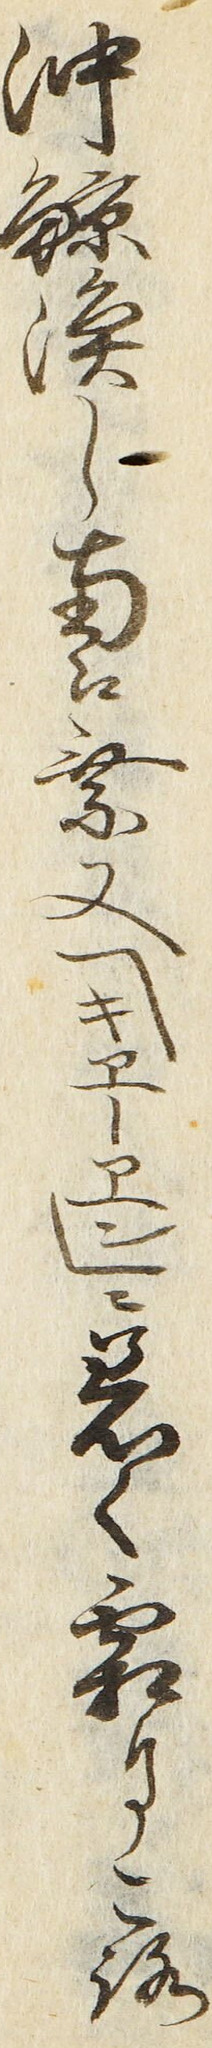沖鯨漁し南江乗又「キヱーヱン」ニ着く霜月ころ
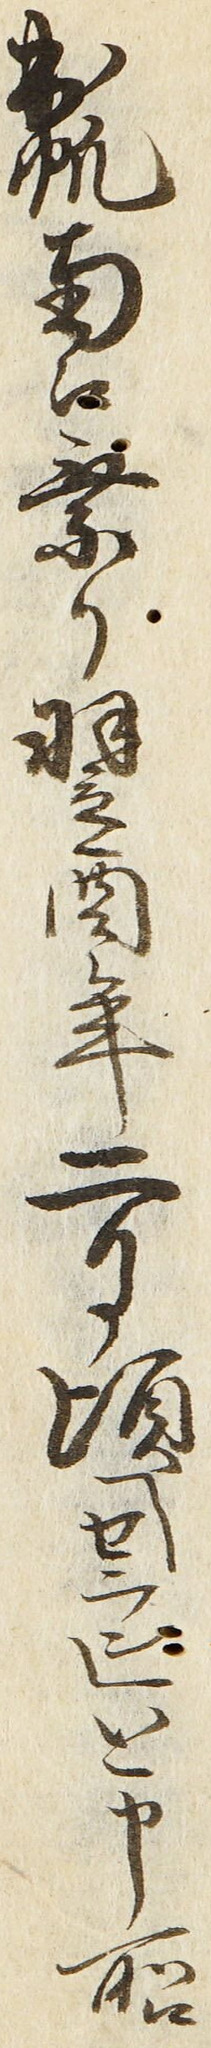出帆南江乗り翌酉年二月頃「セラン」と申所江
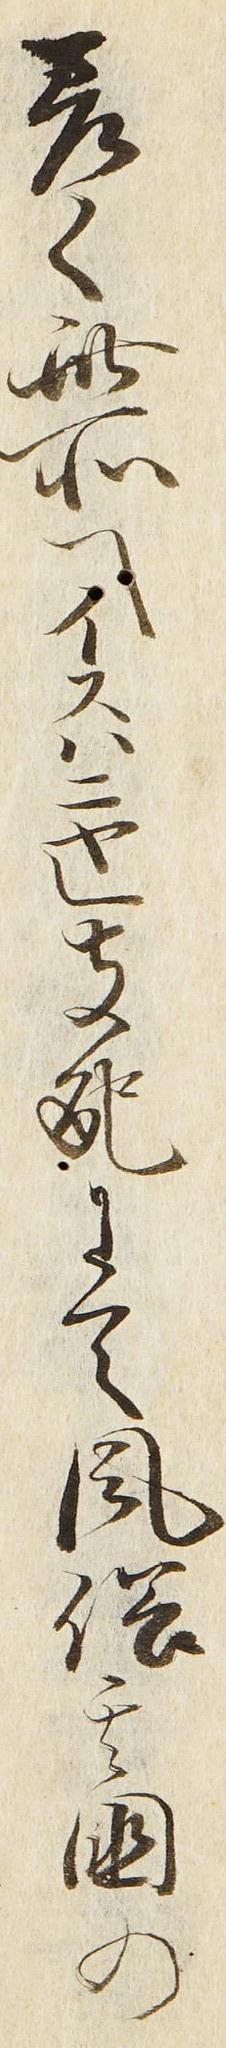着く此所「イスハニヤ」支配にて風俗其國の
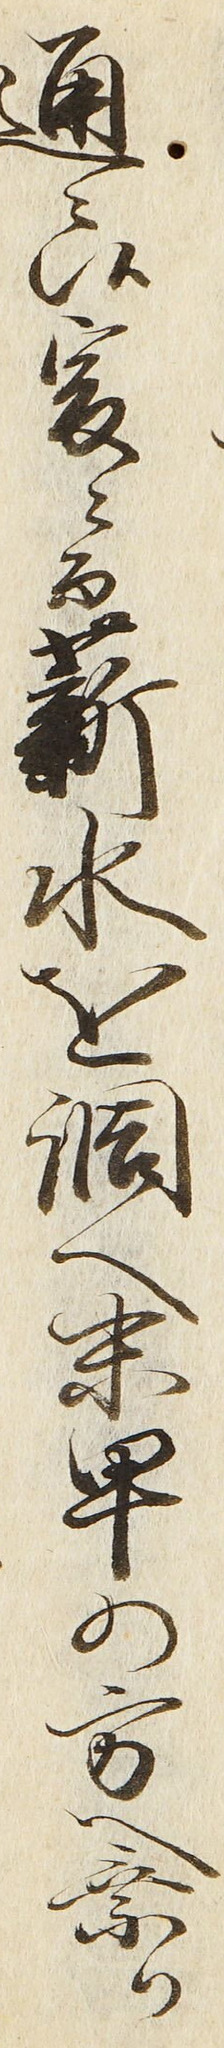通ニ候爰ニ而薪水を調へ未申の方へ乗り
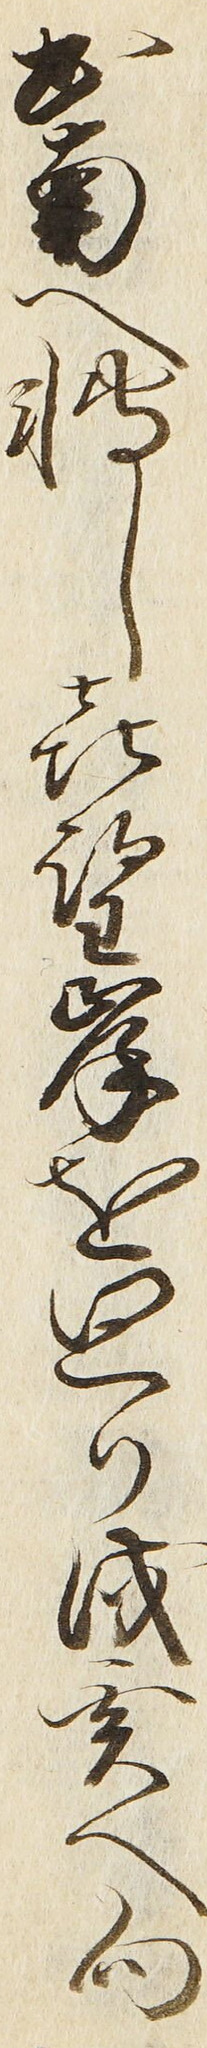出南へ轉し喜望峯を廻り戌亥へ向
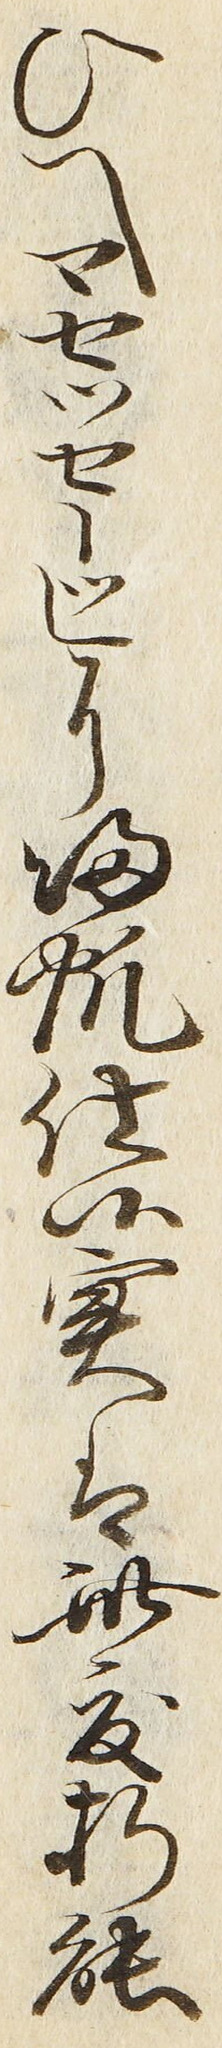ひ「マセツセーツ」に帰帆仕候実は此度折能
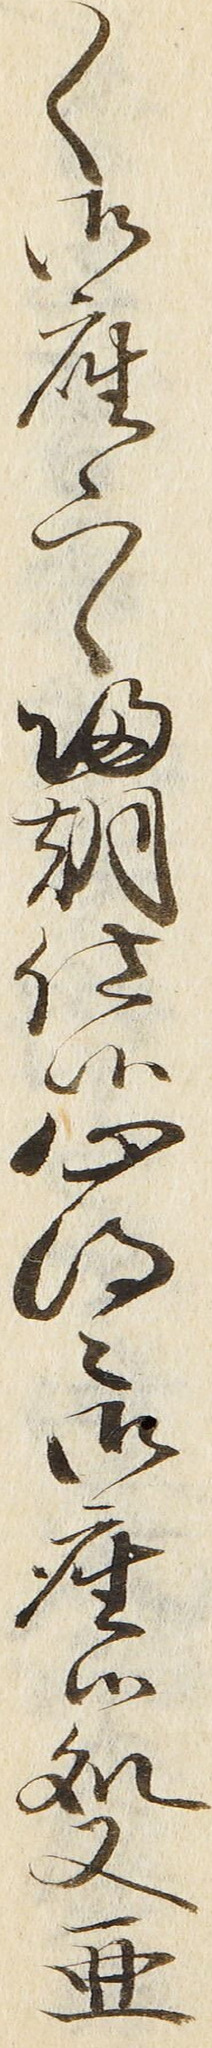く御座候ハヽ帰朝仕候心得ニ御座候処又亜
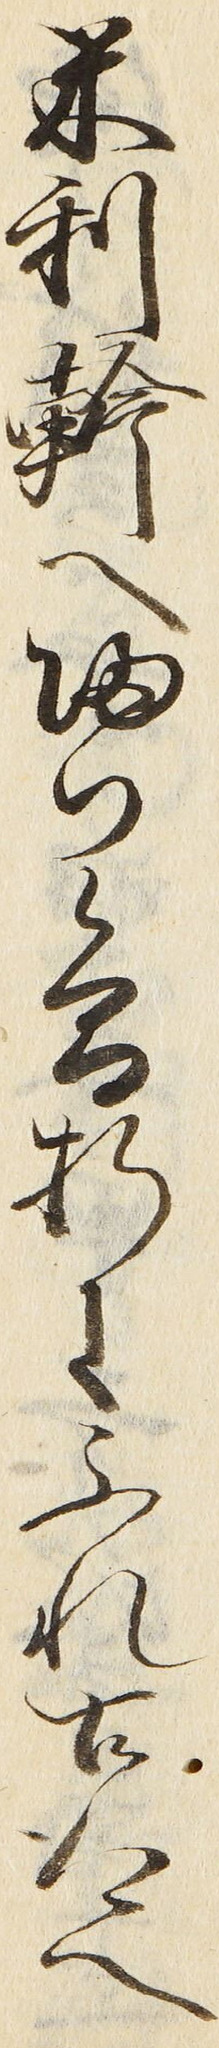米利幹へ帰り候間折にふれ故郷へ
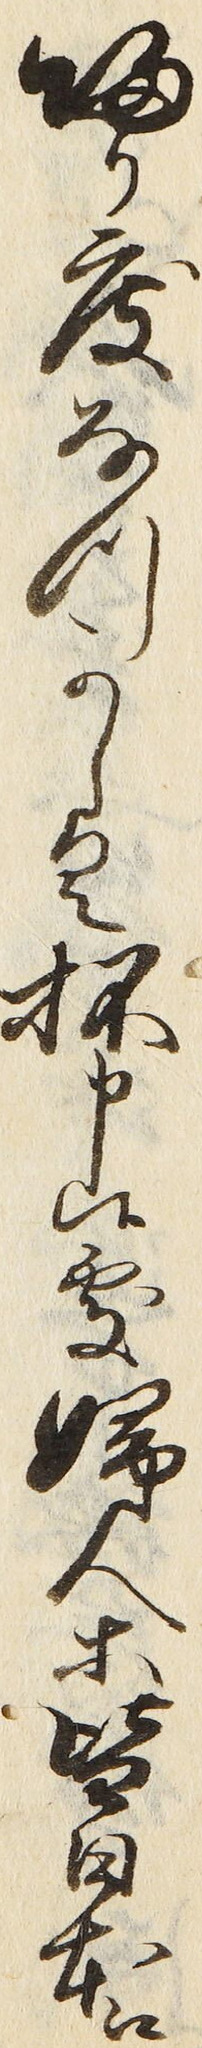帰り度なつかしく抔申候處婦人等皆日本江
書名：漂客談寄
